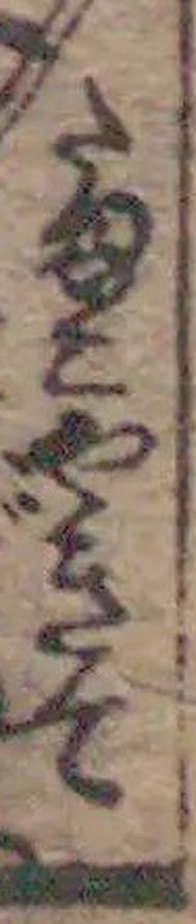たまこやきて
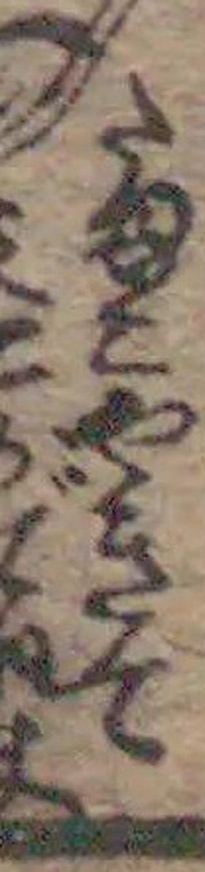たまこやきて
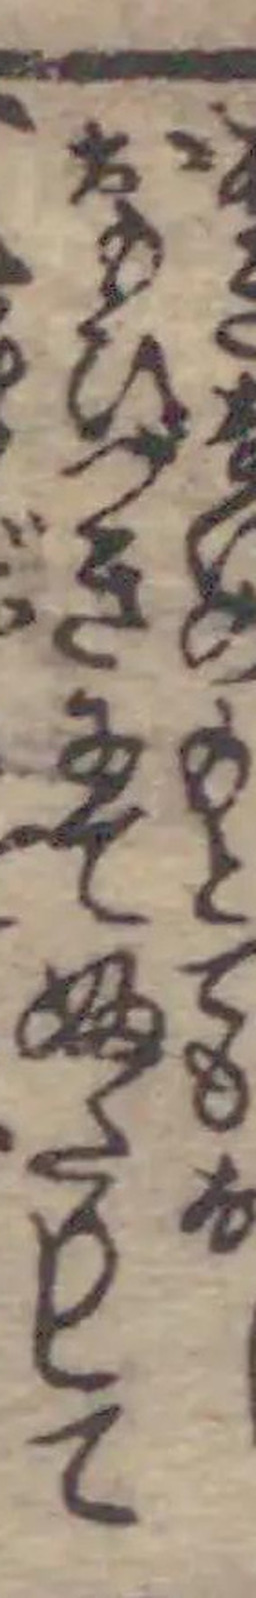おもひつきにてふたりして
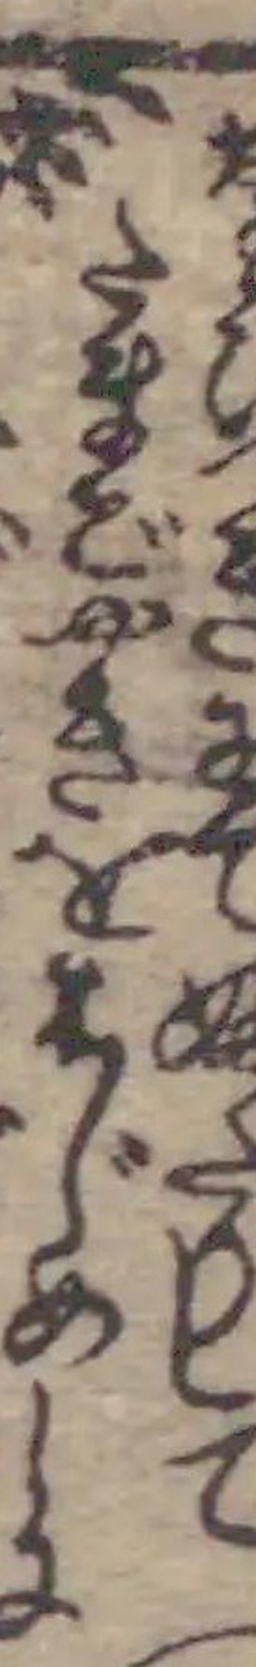たまごやきをはじめしに
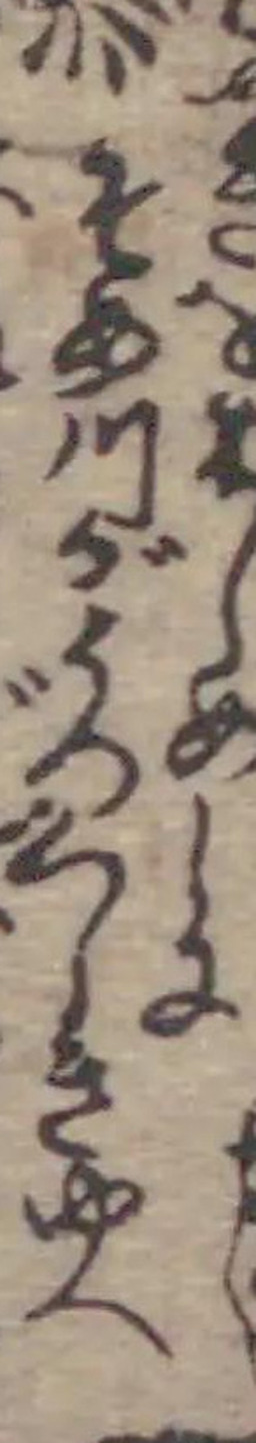そめ川がうつくしきゆへ
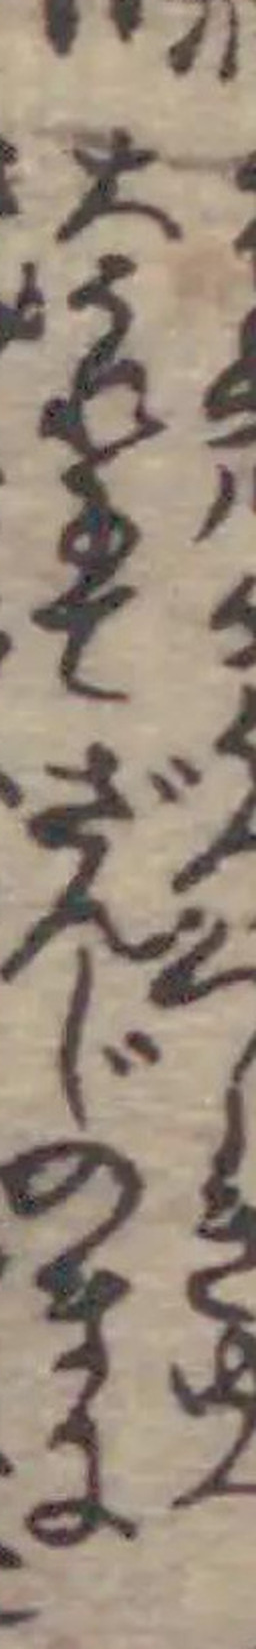大うれにてざんじのまに
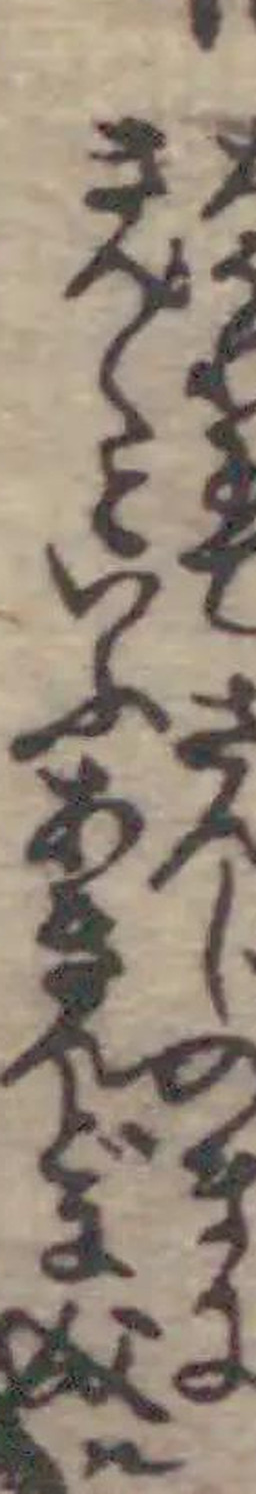きん〳〵といふあきんどに成
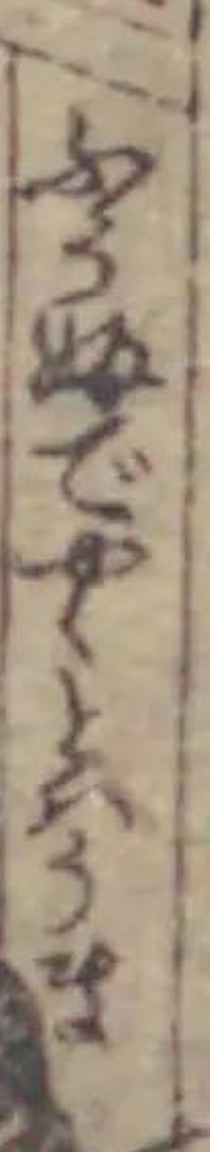ふうふでやくとはうま
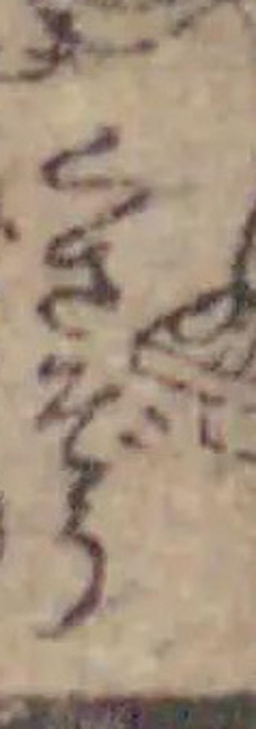くさぞう
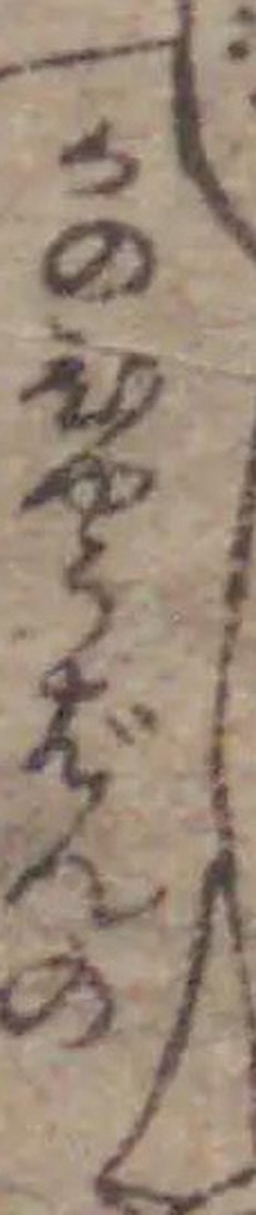かのひやうばんの
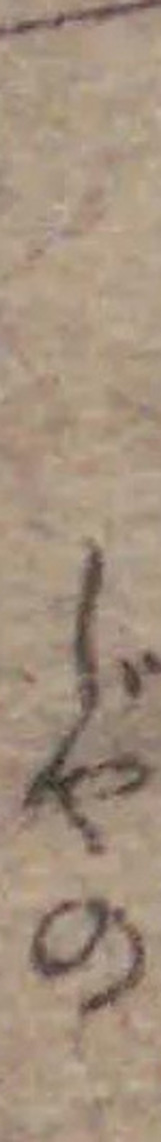じやの
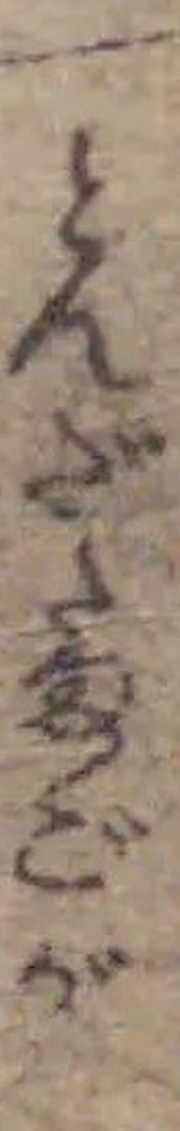とんだたまごが
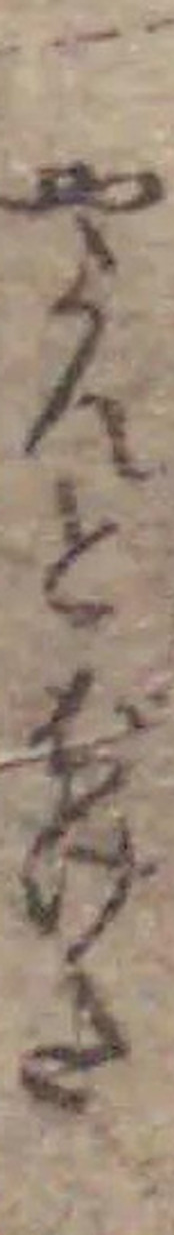やかんとばけた

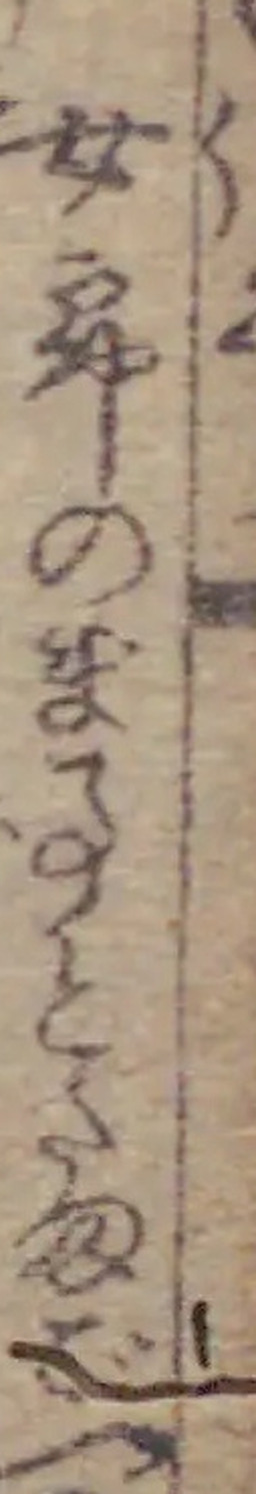女郎のま事とたまご
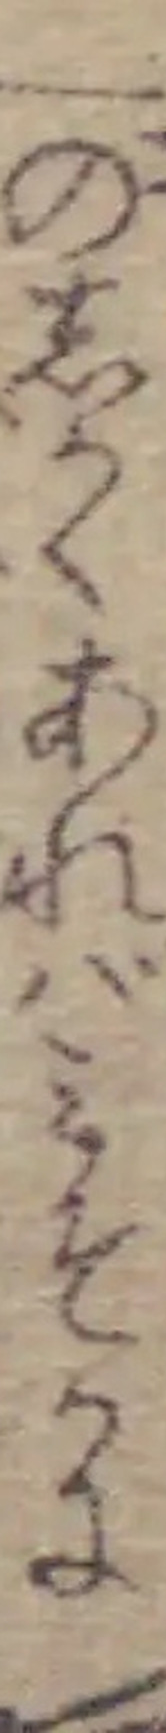のしかくあればみそかに
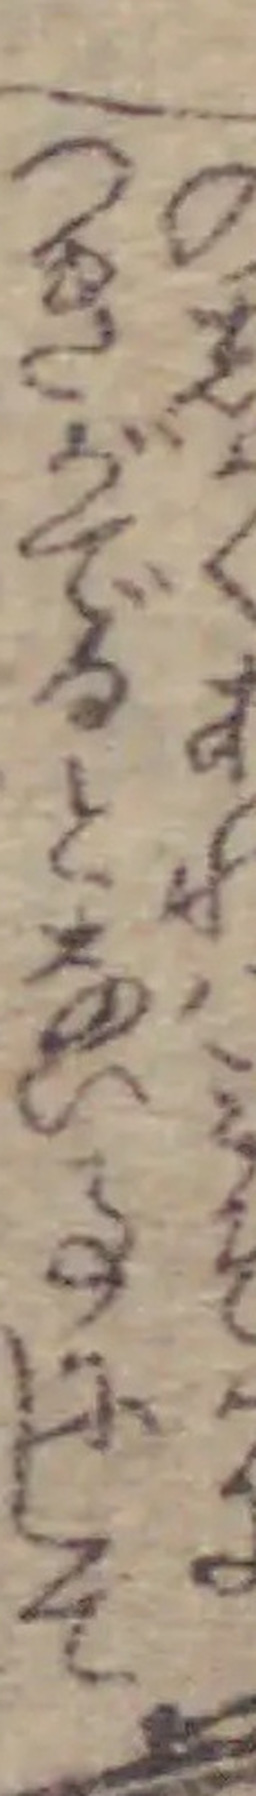つきがでるとない事にして
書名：虚言弥二郎傾城誠 3巻
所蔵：国立国会図書館 National Diet Library, JAPAN
